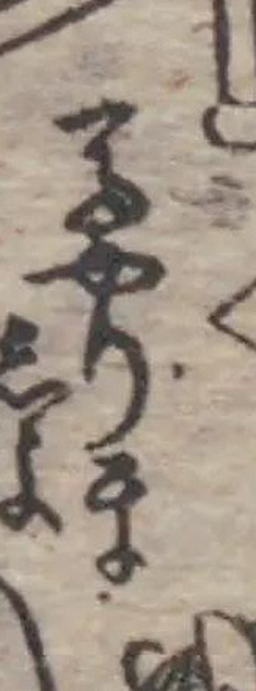馬やりま
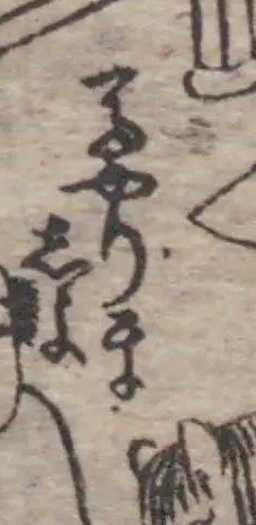馬やりま
